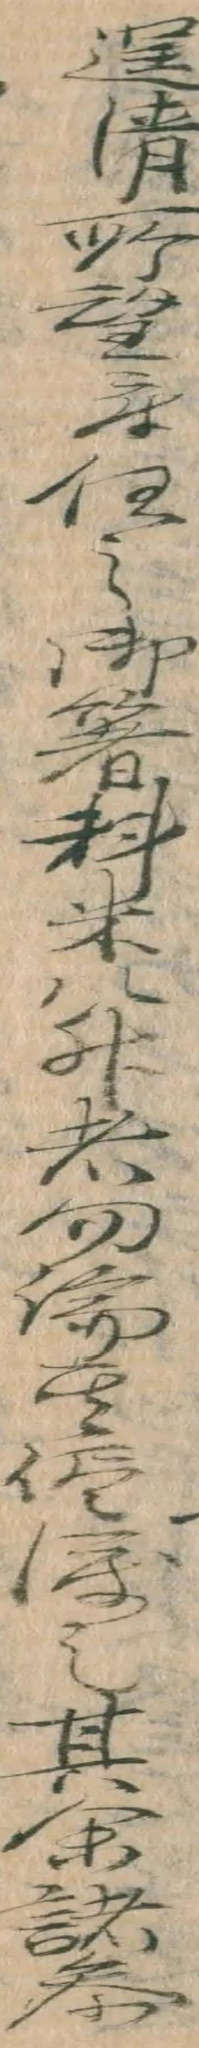逞清所望ニ付任之御著料米八升者勿論其儘渡之其余諸参
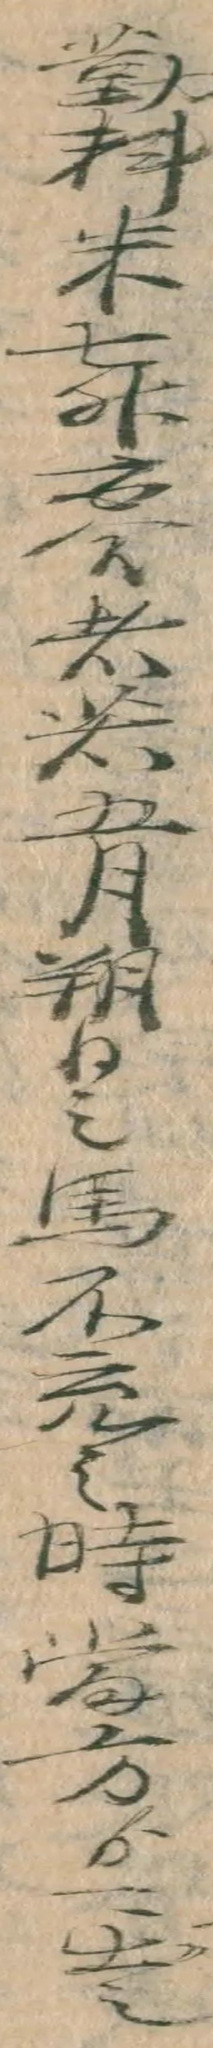勤料米七升五合者若五月朔日之馬不充之時當方ゟ可出之
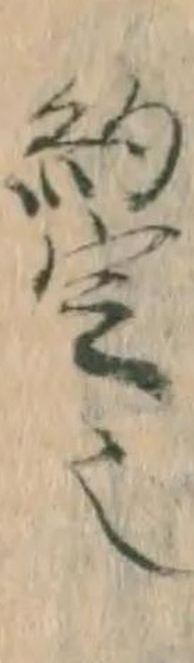約定也
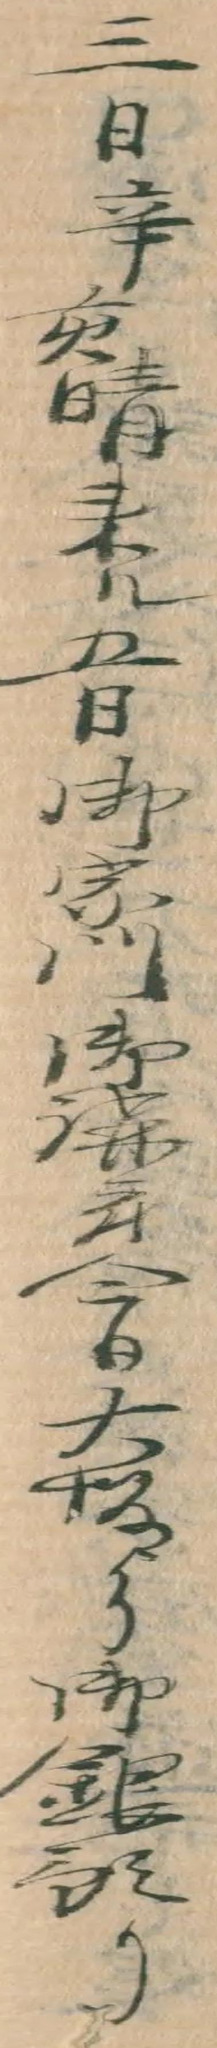三日辛亥晴来ル五日御家門御講ニ付今日大坂より御銀預リ
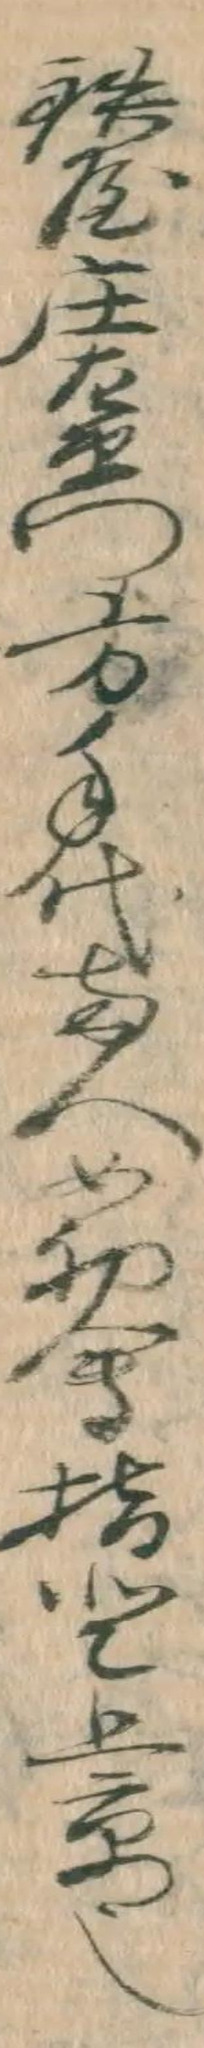鉄屋庄左衛門方手代両人如初會指登上京也
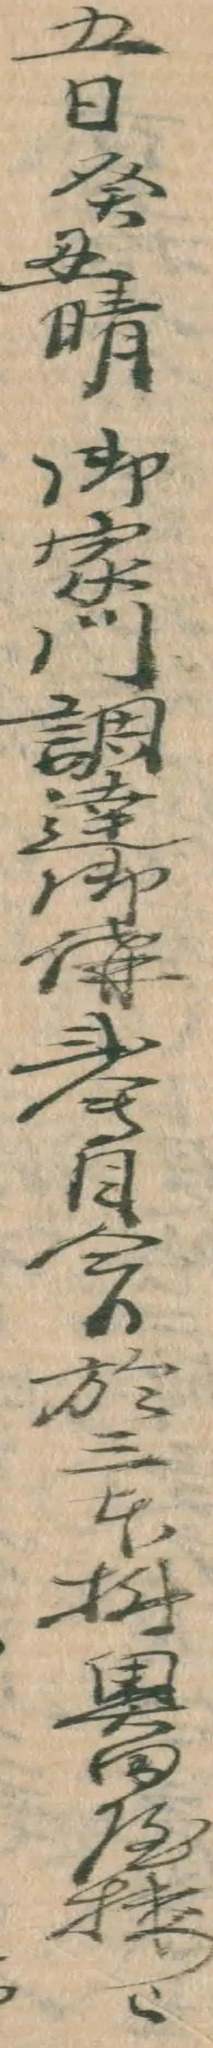五日癸丑晴御家門調達御講弐會目今日於三本拊奥田屋様被
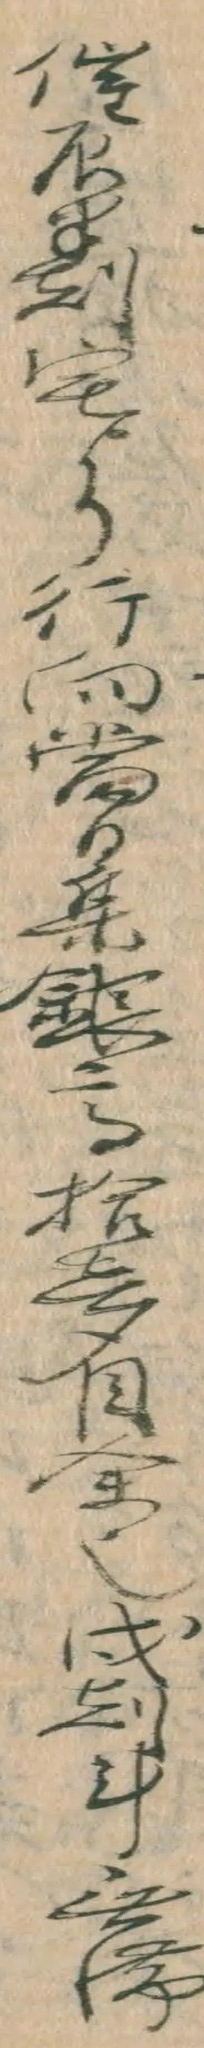催辰半刻宅より行向當日集銀高拾壱貫目余也戌刻斗無滞
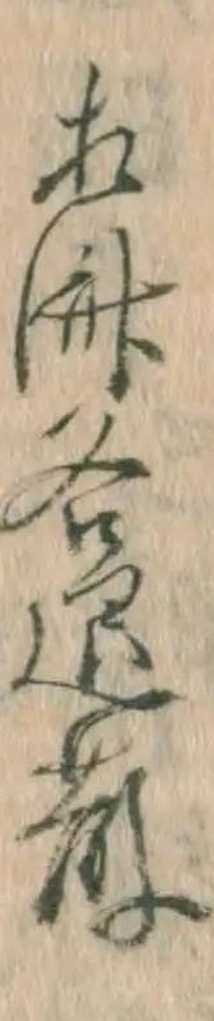相済各退散
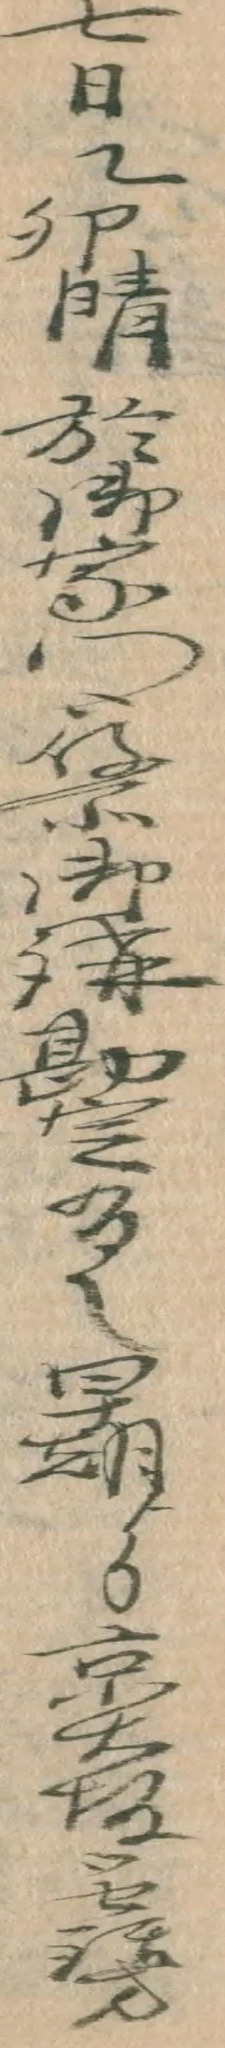七日乙卯晴於御家御役所御講勘定有之早朝より京大坂御世話方
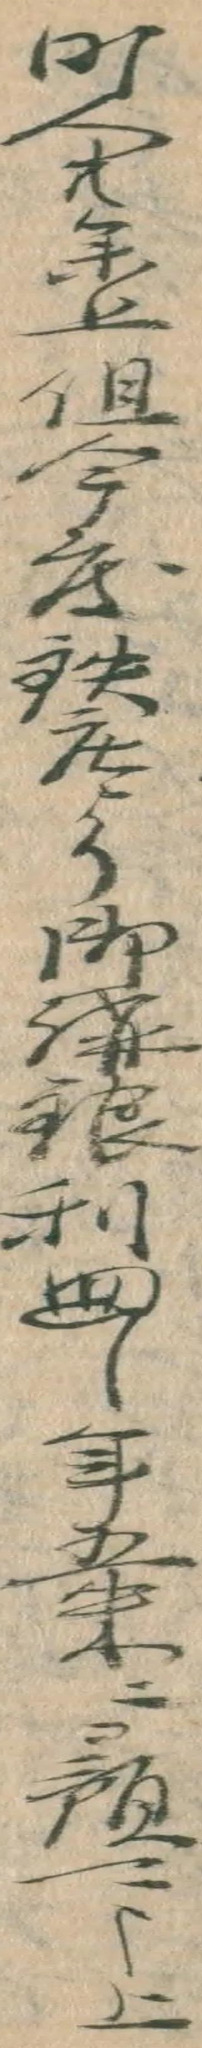町人共参上但今度鉄庄より御講銀利回し年五朱ニ御預可申上
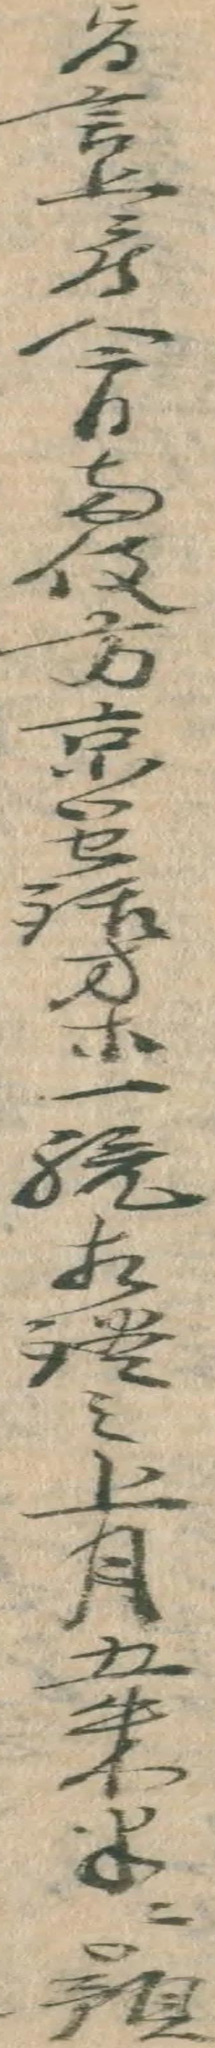旨言上ニ付今日両役方京御世話方等一統相談之上月五朱半ニ御預
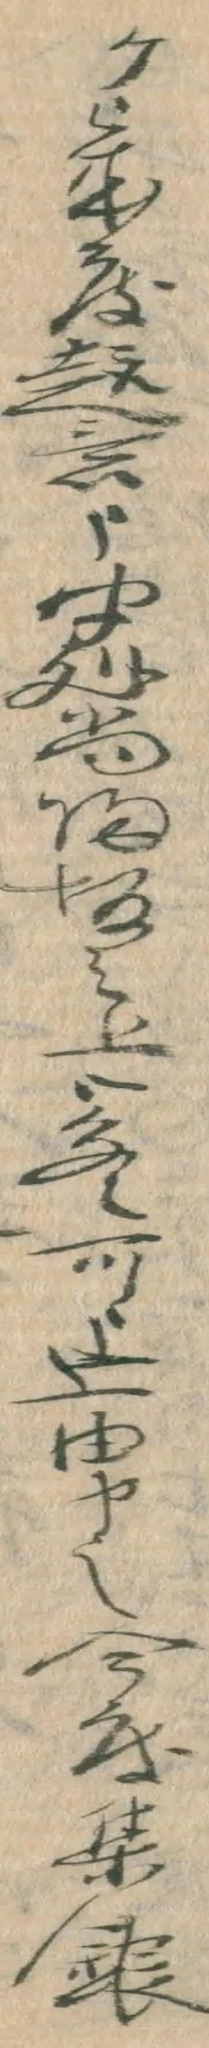ケ被成度趣意申聞処尚帰坂之上御参可被止由申之今度集裏
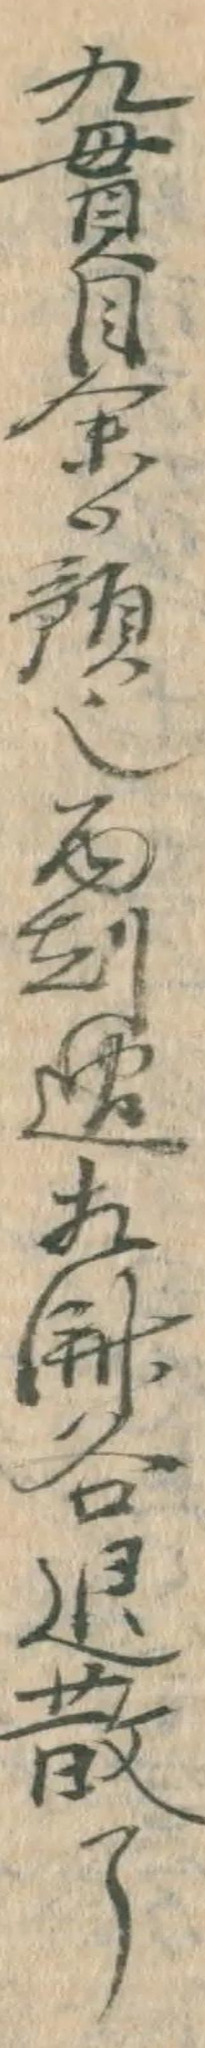九貫目余御預也酉刻過相済各退散了
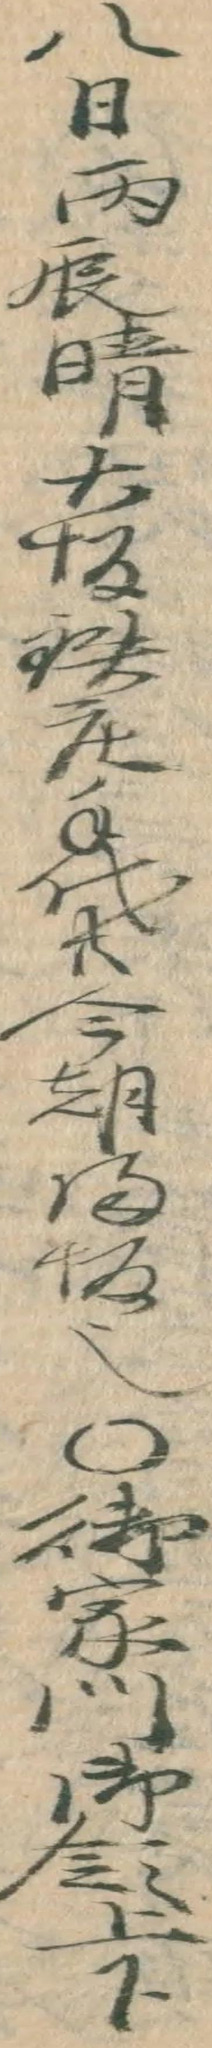八日丙辰晴大坂鉄庄手代共今朝帰坂也○御家門御領上下
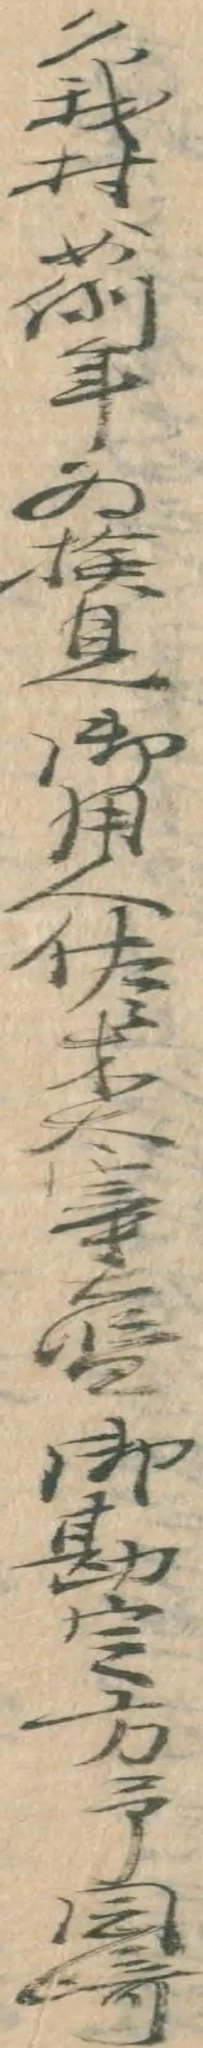久我村へ如例年為検見御用人佐々木太等藍御勘定方予国崎
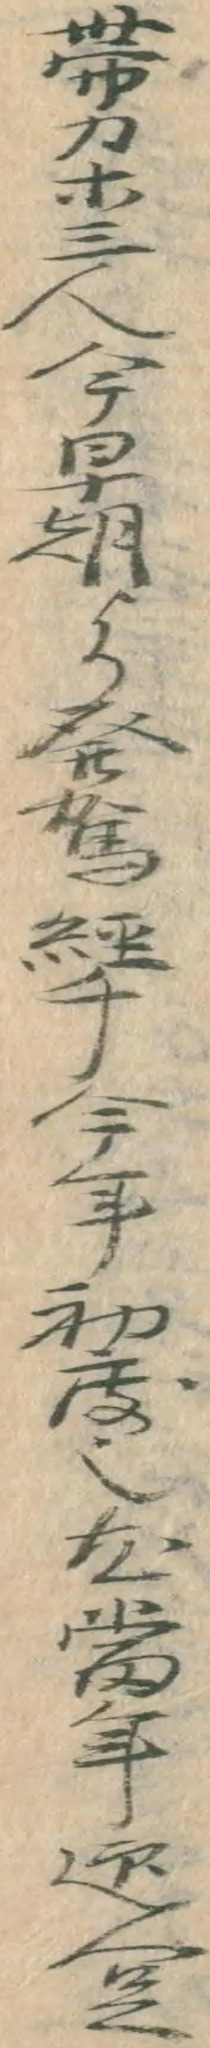帯刀等三人今早朝より発駕経千今年初度也尤當年迎人足
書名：賀茂社記録. 第65冊
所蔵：国立国会図書館 National Diet Library, JAPAN
